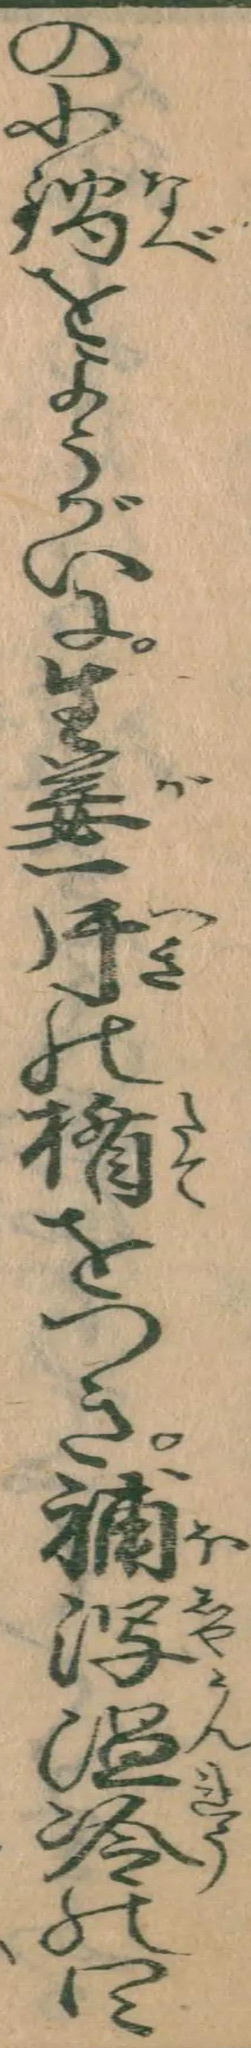の小鍋をようがいに。生姜一片の楯をつき。補瀉温冷の四
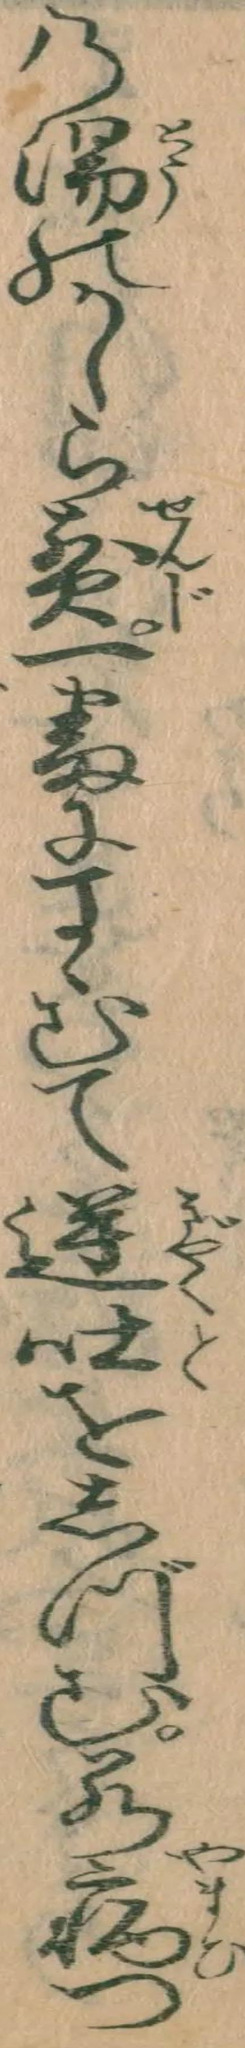の湯のかしら煎。一番にすゝむて逆吐をしづむ。若病つ
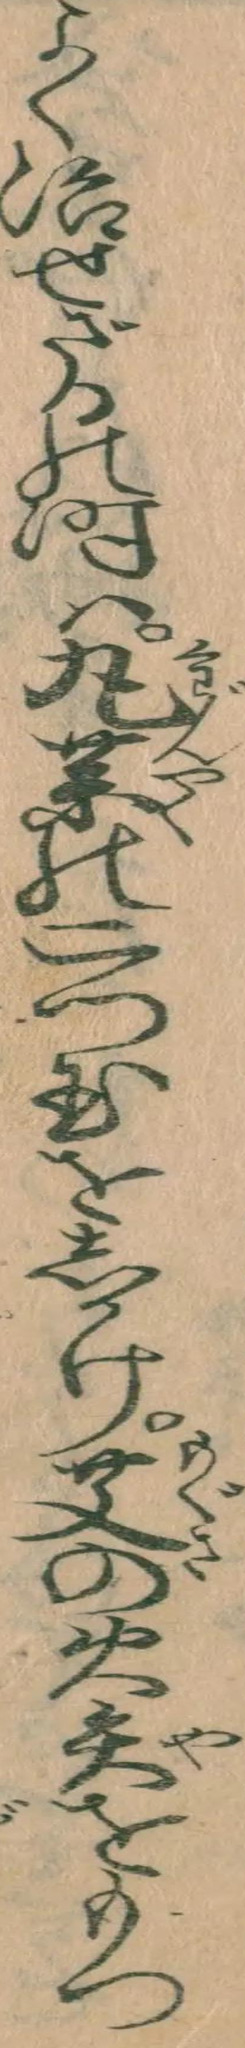よく治せざるの時は。丸薬の二つ玉をしかけ。艾の火矢をもつ
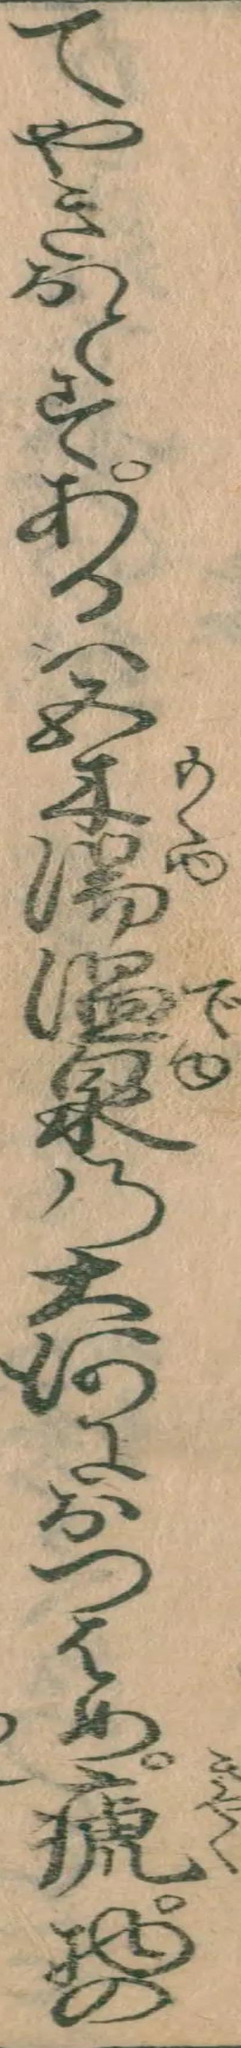てやきおとす。あるは五木湯温泉の大河におつはめ。瘧。物の
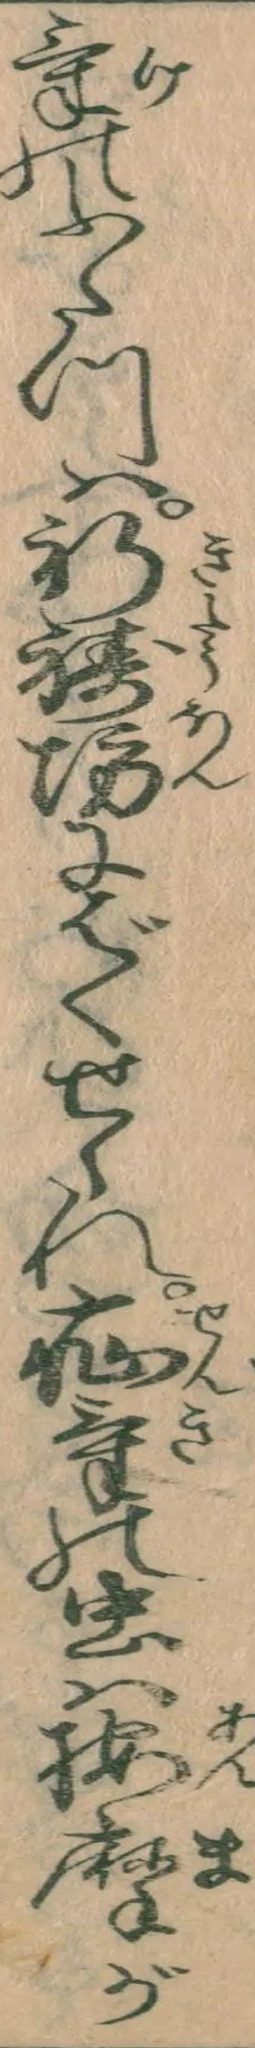気のふたつは。祈祷坊にばくせくれ。疝気の虫は按摩が
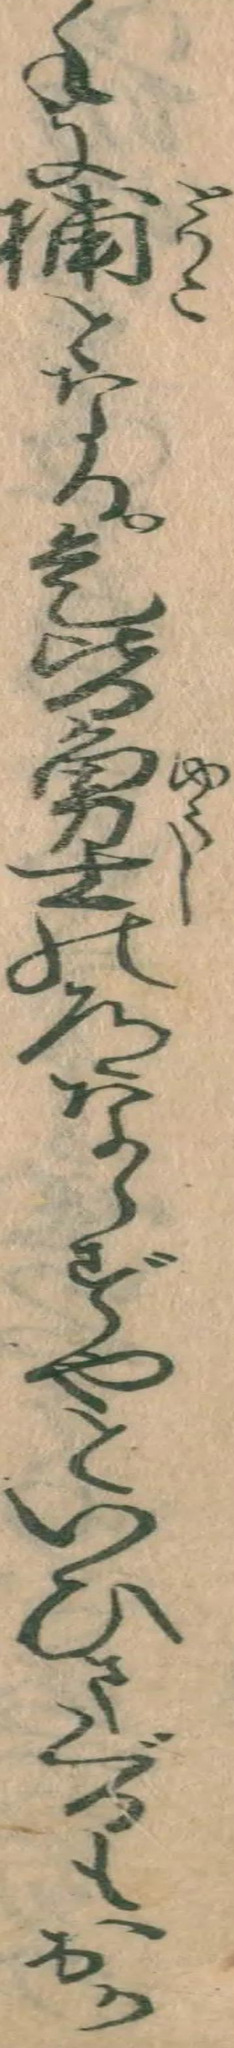手に捕となる。是皆勇士の道ならずやといひまぐるもおか
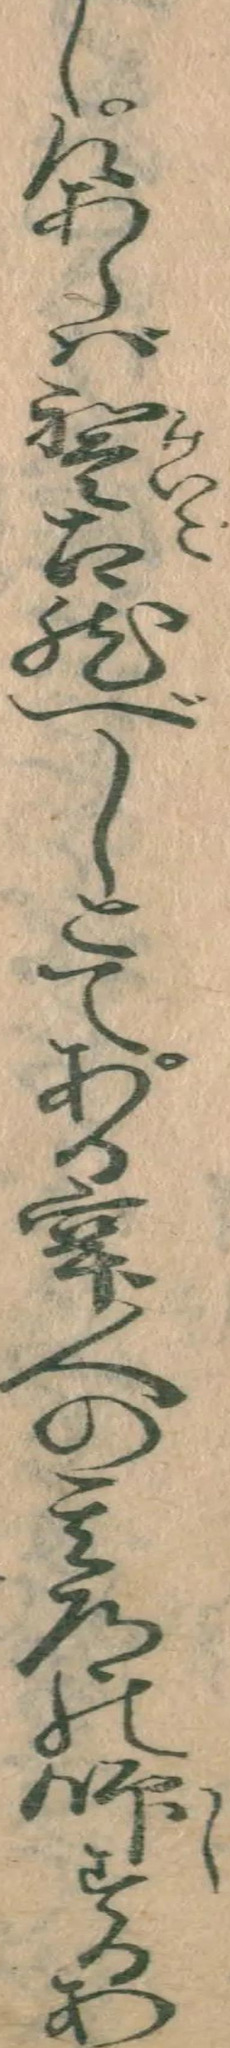し。けあらば稽古然べしとて。ある牢人の其道の師するあ
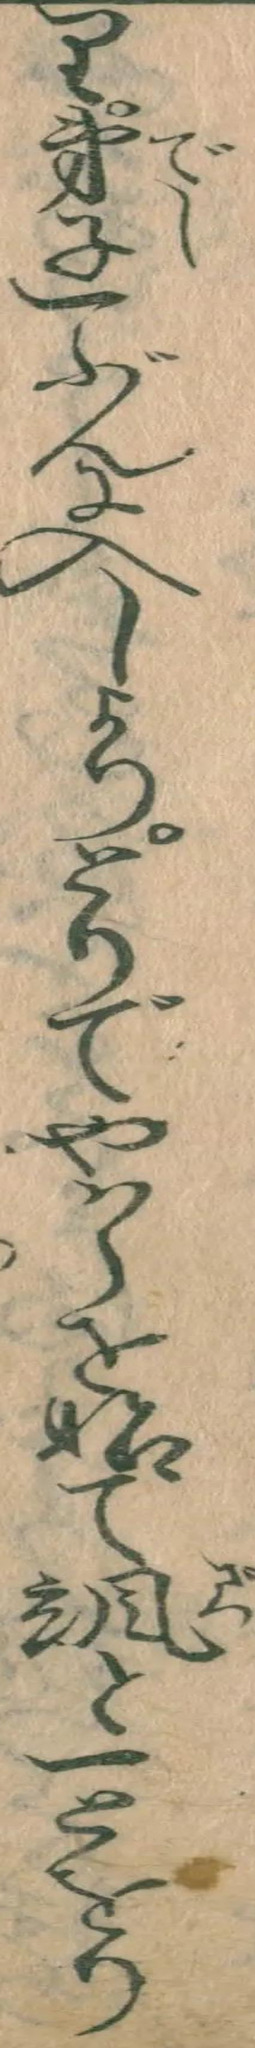り。弟子一ぶんに入しより。とりでやからを始て颯と一とをり
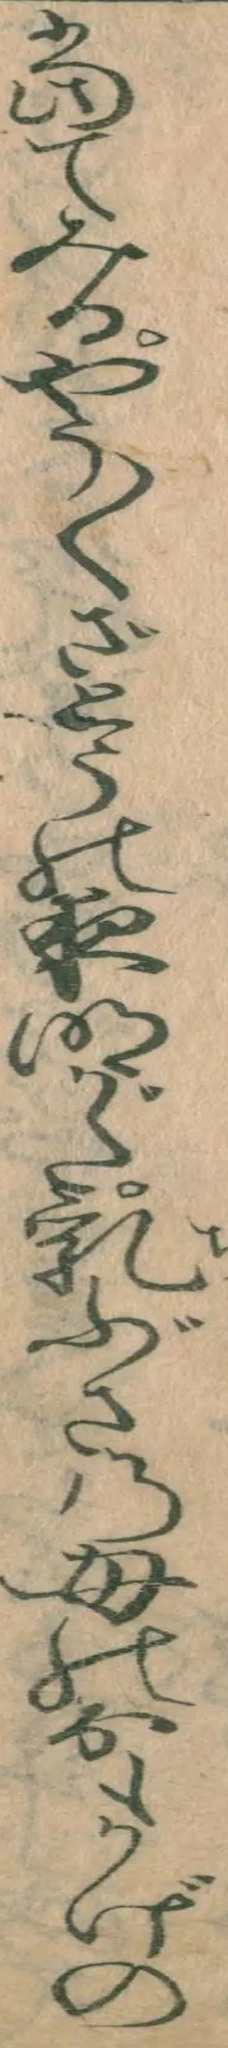当てみる。やう〳〵ざとうの夜明がた。乳ぶさの母のおもかげの
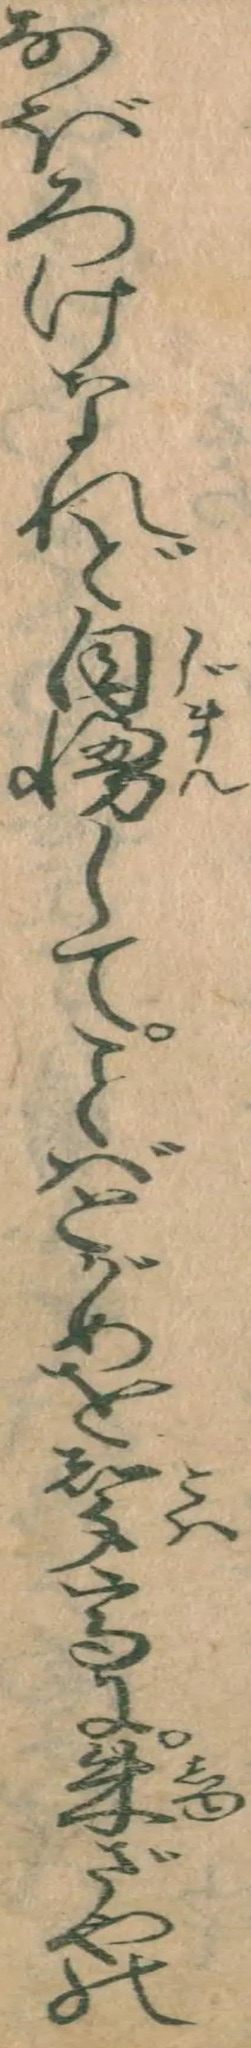おぼろけなれど自慢して。ことばとがめを声高に。朱ざやの

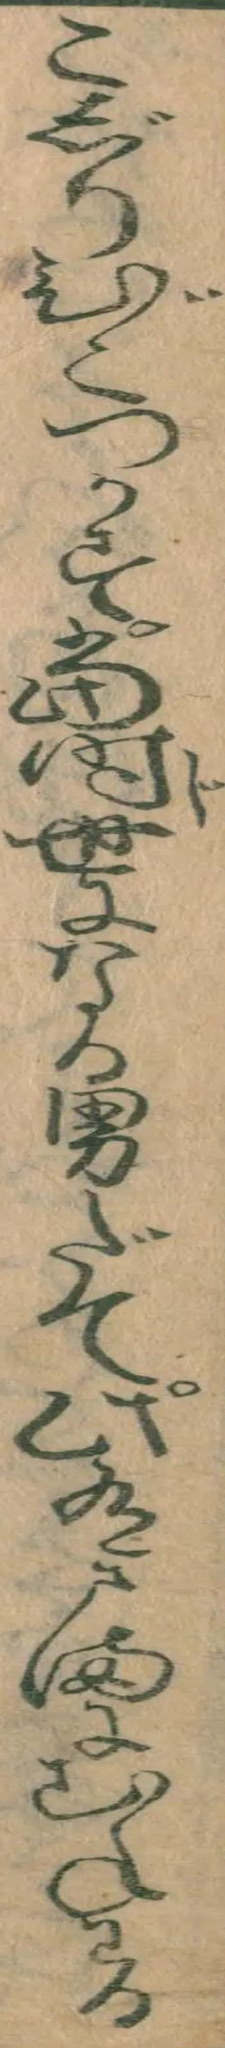こじりびこつかす。当時世になる男だて。此有さまにむねわる
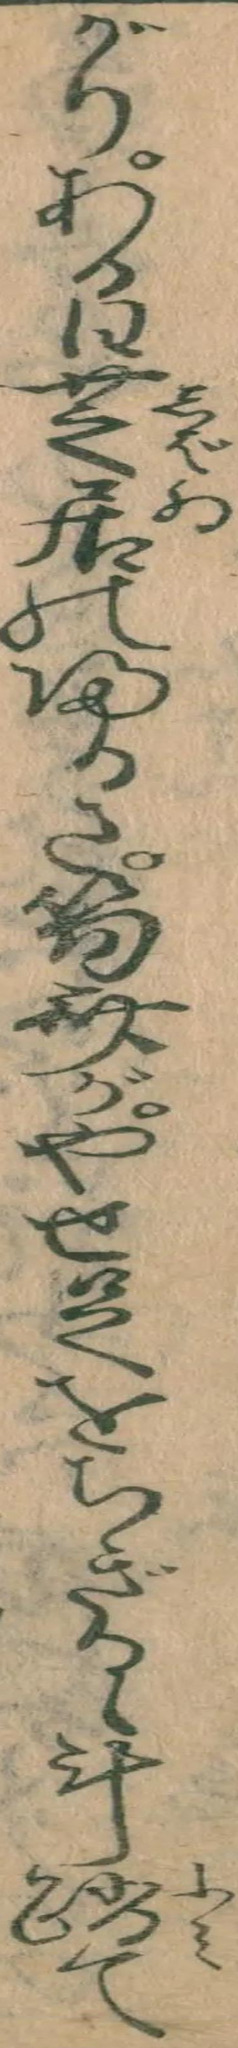がり。ある日芝居の帰るさ。筍斎が。やせ足をちぎるゝ計踏て
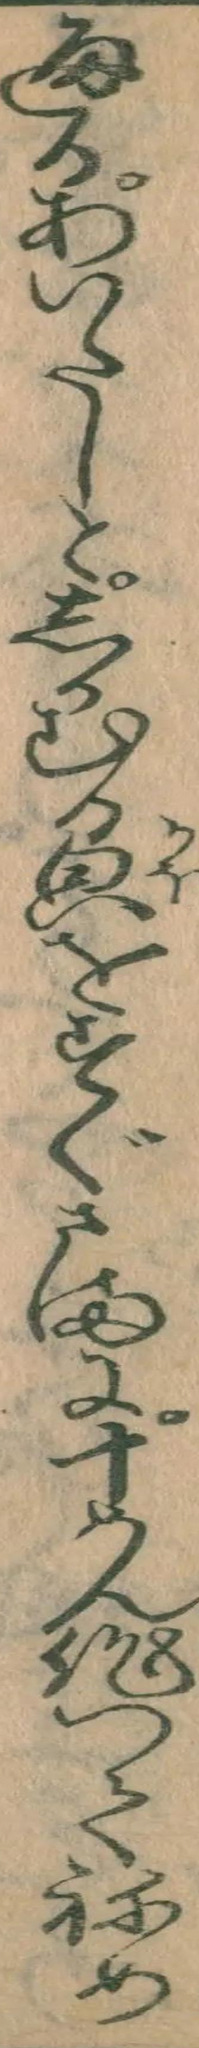通る。あいたしと。しかむる貌をすぐさまに。十めん作つてねめ
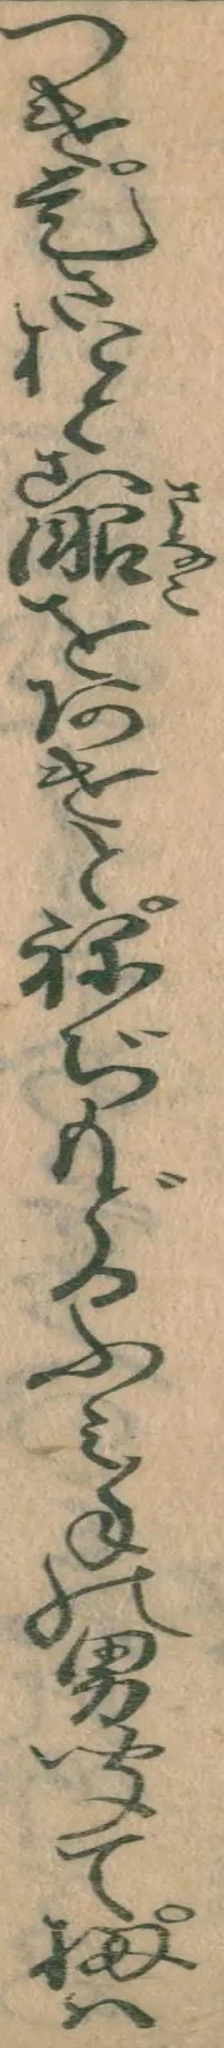つけ。是さおとこ眼をあけと。ねぢもどるふみ手の男聞て。扨は
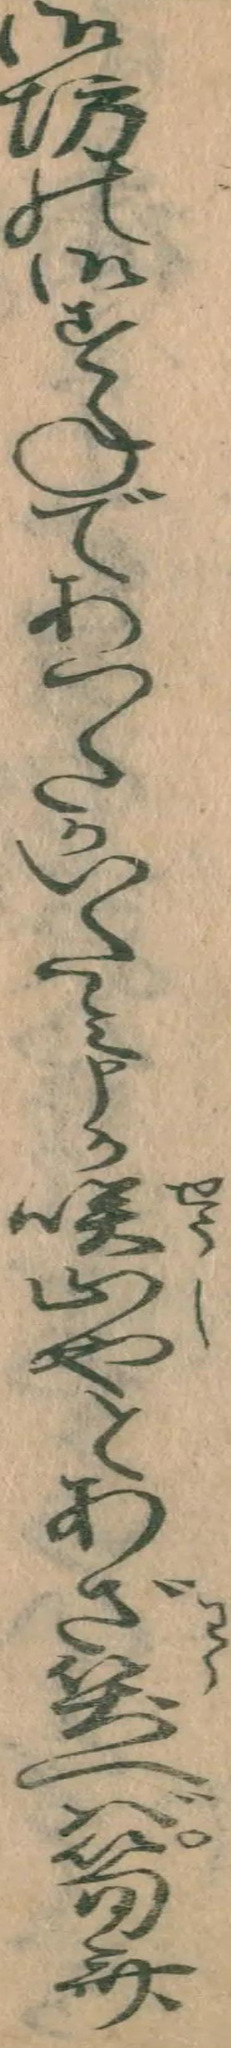御坊の御すねであつたかいたみ申か咲止やとあざ笑へば。筍斎
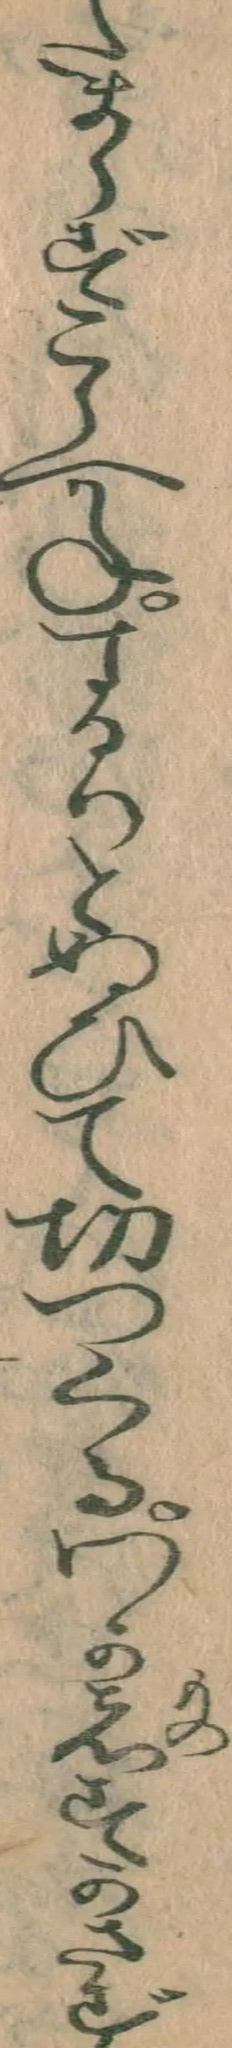たまらずこらへかね。するりとぬひて切つくる。わか者すかさず
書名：新竹斎 5巻
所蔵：国立国会図書館 National Diet Library, JAPAN
